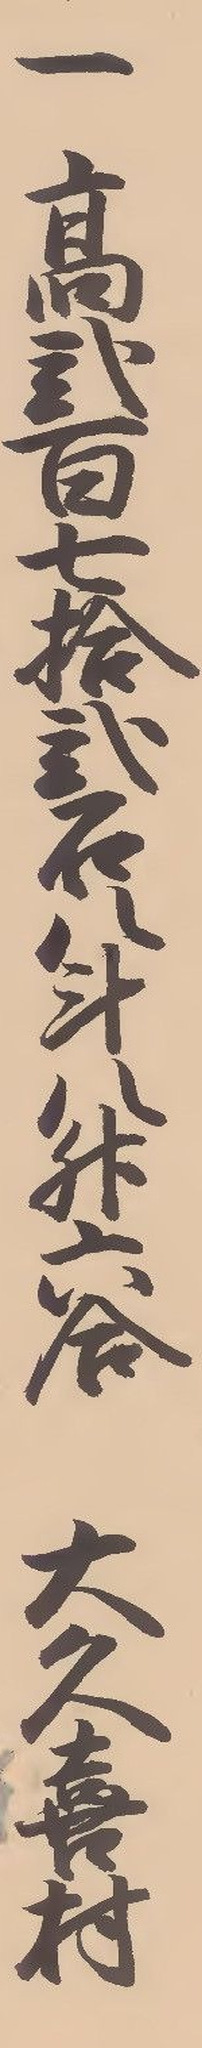一高弐百七拾弐石八斗八升六合大久喜村

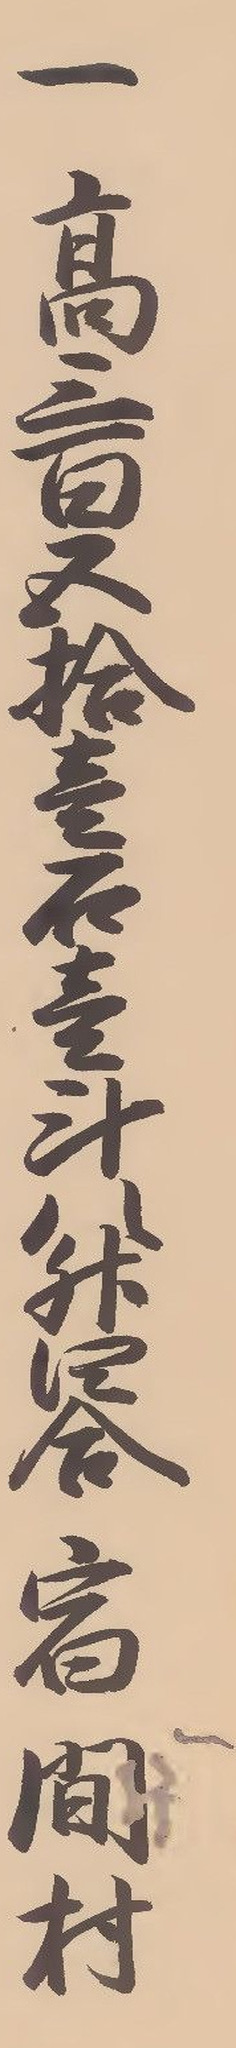一高三百五拾壱石壱斗八升四合宿間村
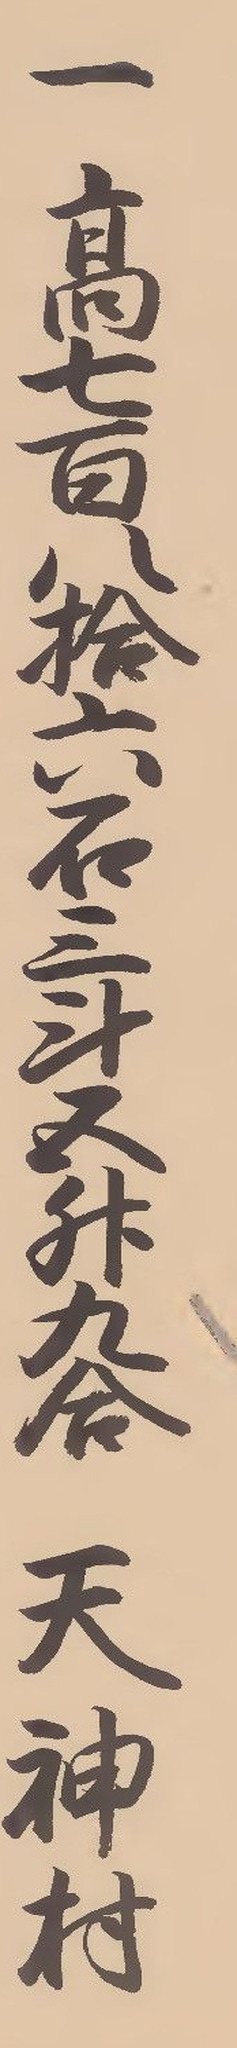一高七百八拾六石三斗五升九合天神村
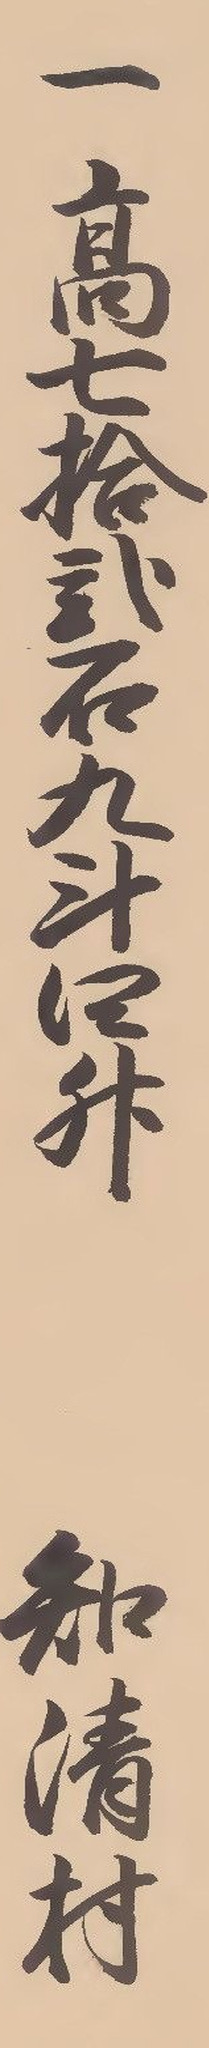一高七拾弐石九斗四升知清村
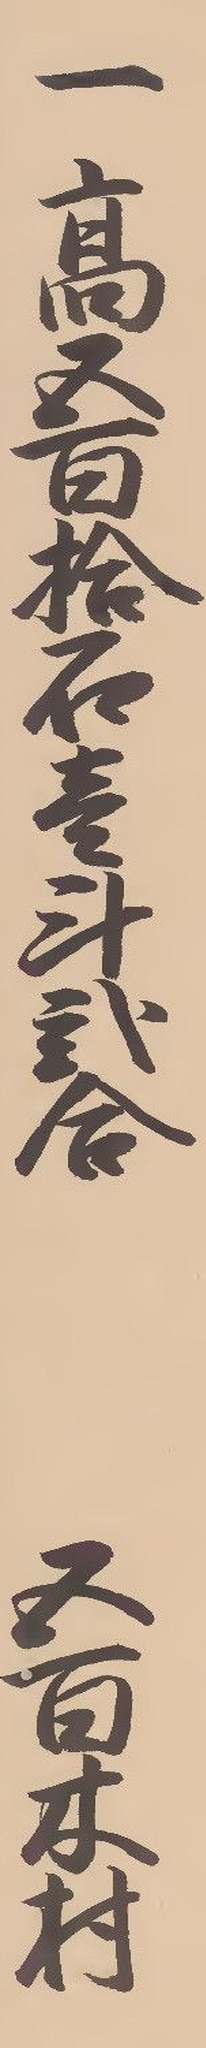一高五百拾石壱斗弐合五百木村
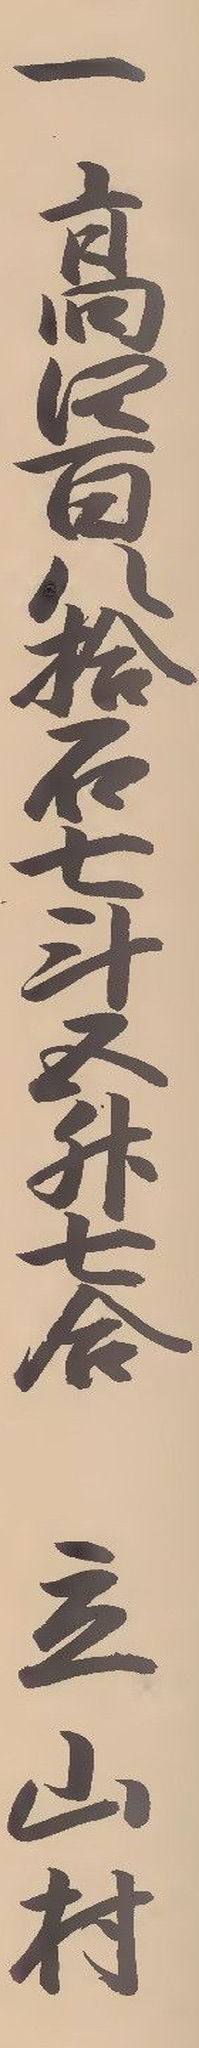一高四百八拾石七斗五升七合立山村
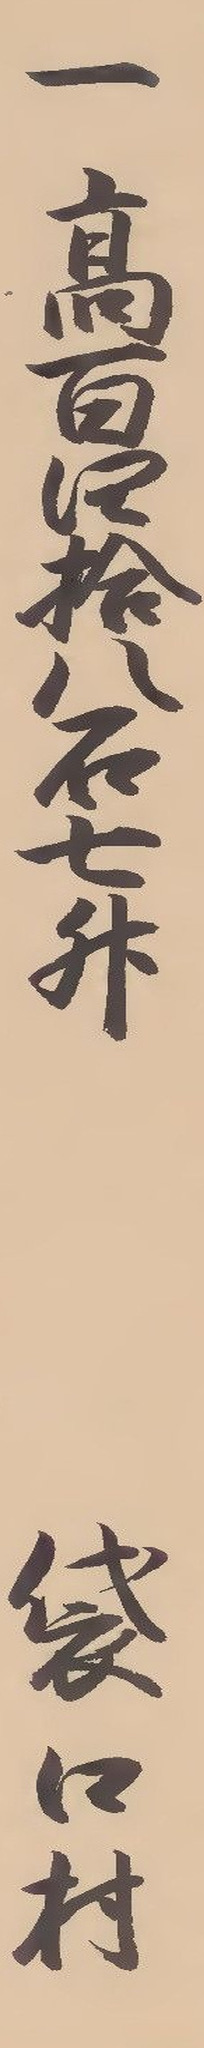一高百四拾八石七升袋口村
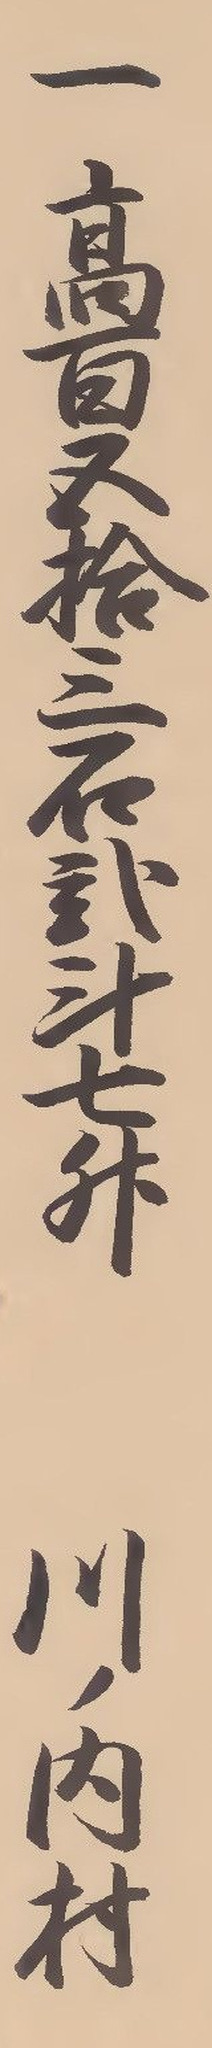一高百五拾三石弐斗七升川ノ内村
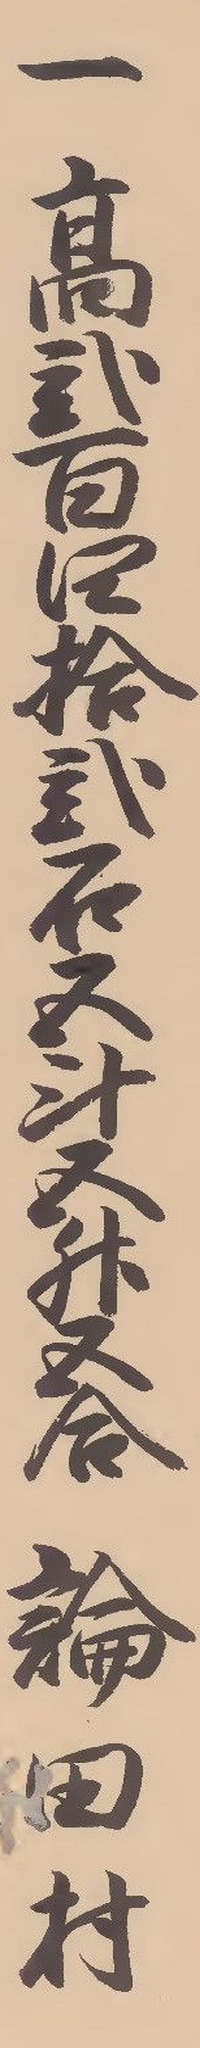一高弐百四拾弐石五斗五升五合論田村

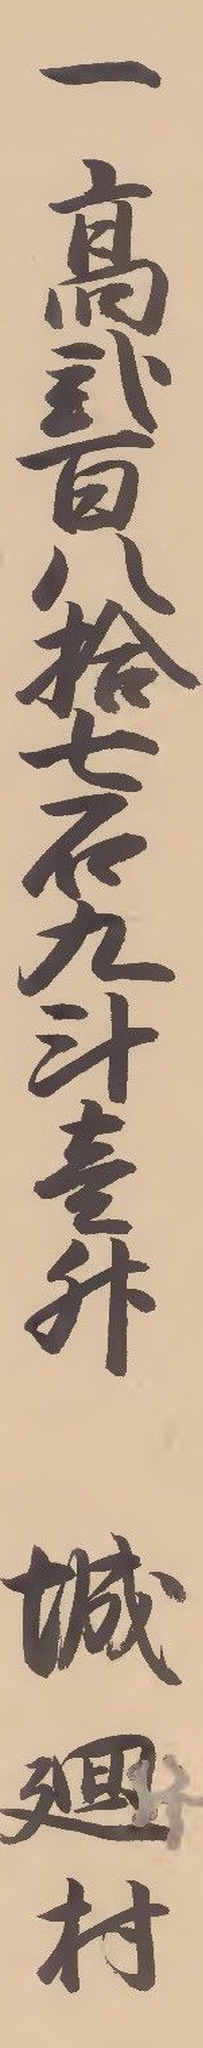一高弐百八拾七石九斗壱升城廻村
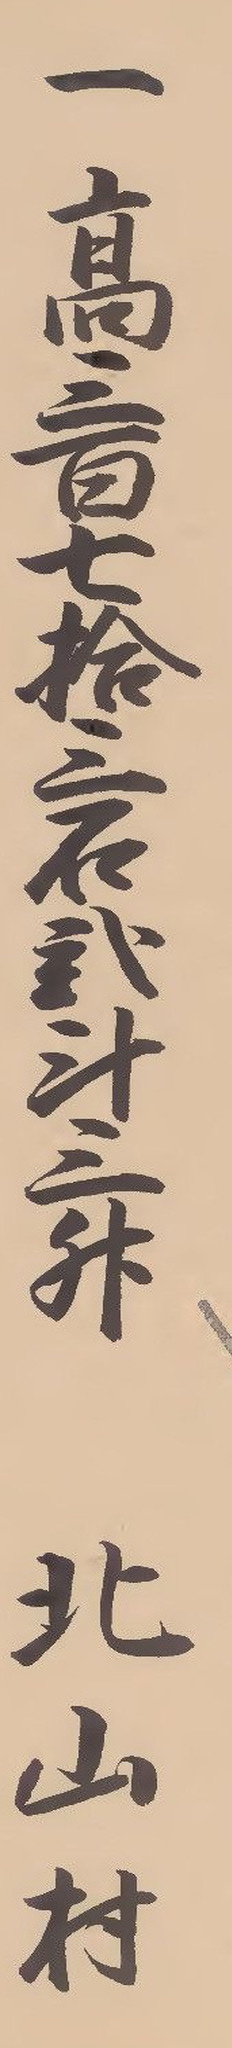一高三百七拾三石弐斗三升北山村
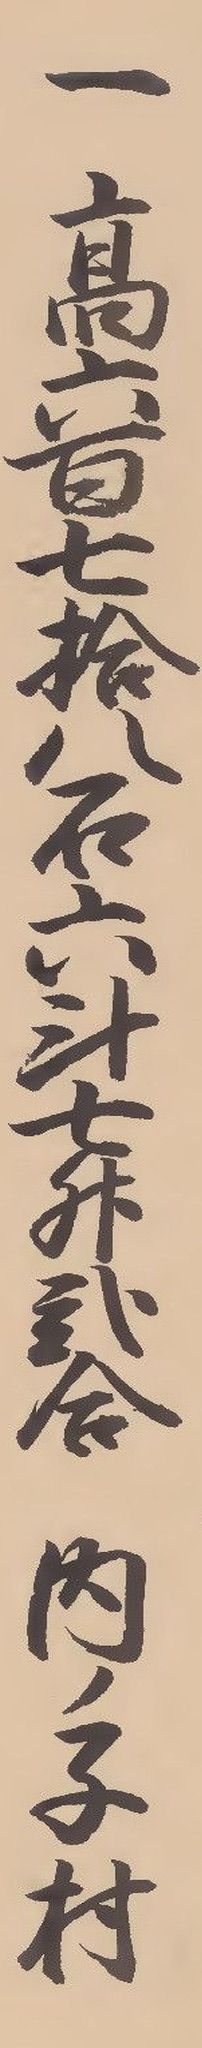一高六百七拾八石六斗七升弐合内ノ子村
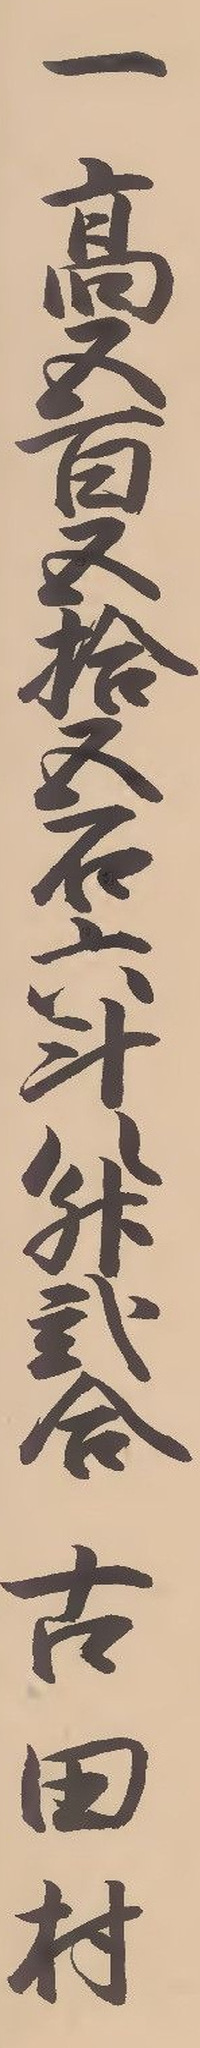一高五百五拾五石六斗八升弐合古田村
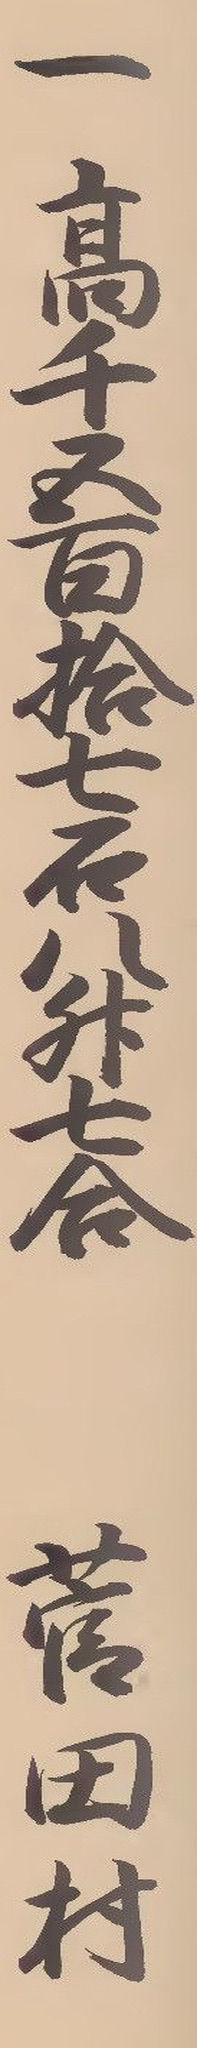一高千五百拾七石八升七合菅田村
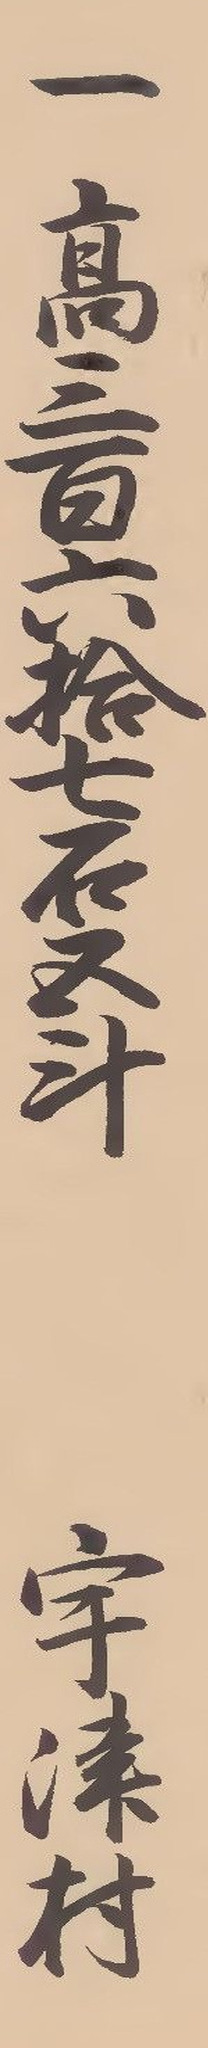一高三百六拾七石五斗宇津村
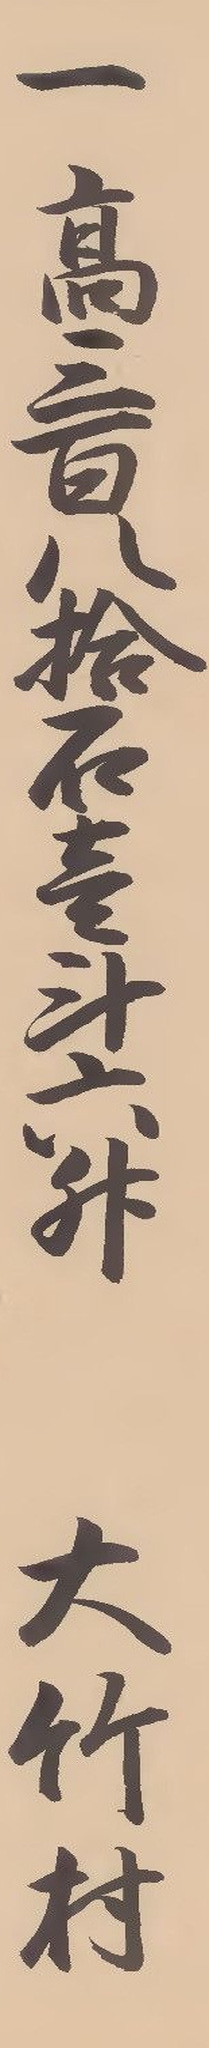一高三百八拾石壱斗六升大竹村
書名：伊予国郷帳
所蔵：国立公文書館 National Archives of Japan
